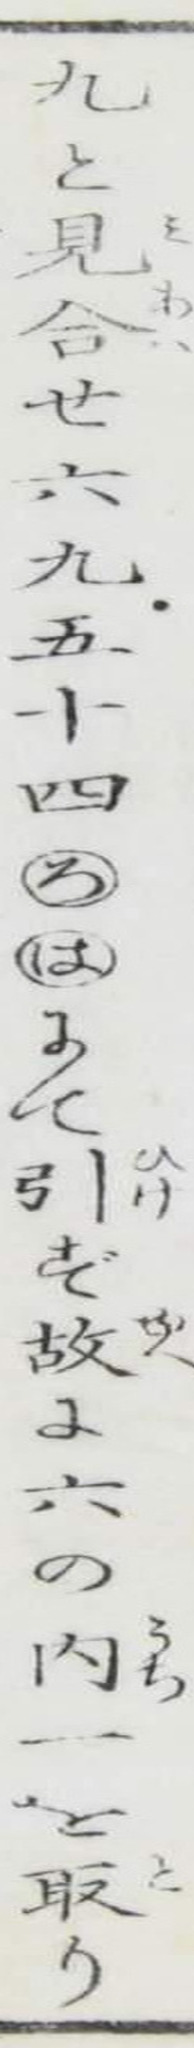九と見合せ六九．五四㋺㋩にて引ず故に六の内一を取り
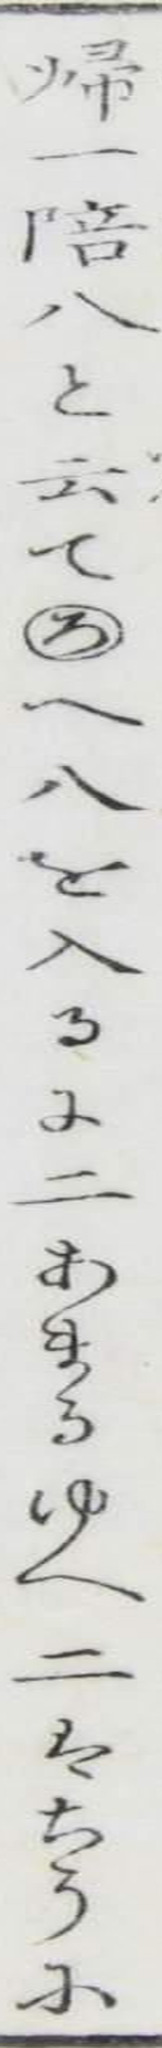帰一陪八と云て㋺へ八を入るに二あまるゆへ二はちうに
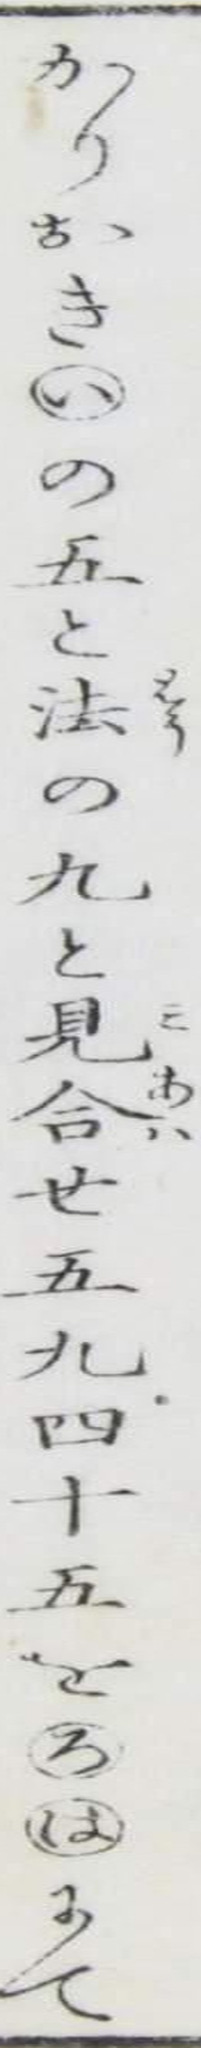かりおき㋑の五と法の九と見合せ五九．四十五を㋺㋩にて
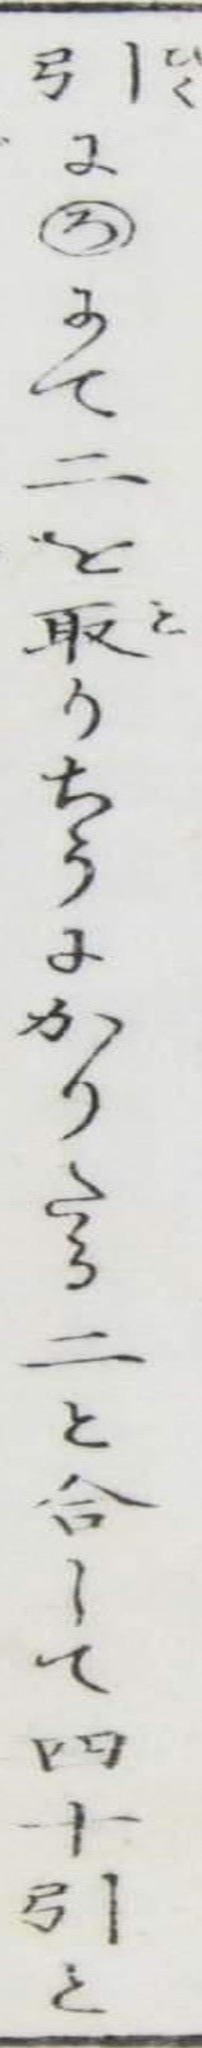引に㋺にて二を取りちうにかりたる二と合して四十引と
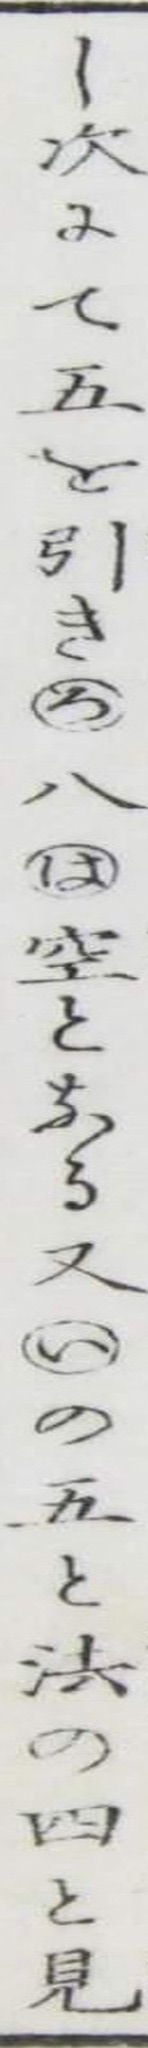し次にて五を引き㋺八㋩空となる又㋑の五と法の四と見
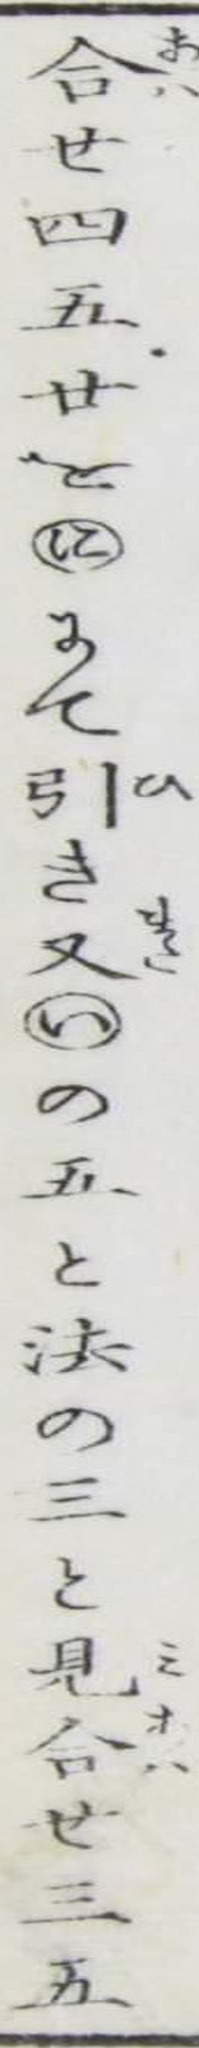合せ四五．廿を㋥にて引き又㋑の五と法の三と見合せ三五
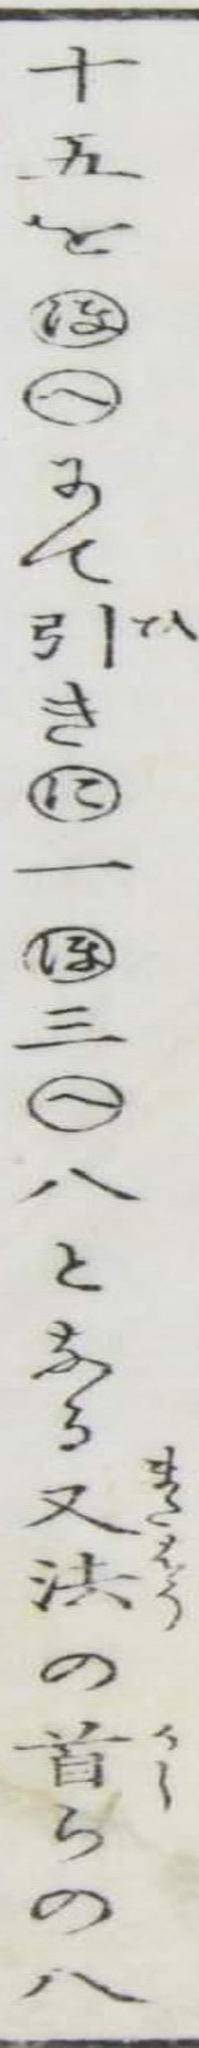十五を㋭㋬にて引き㋥一㋭三㋬八となる又法の首らの八
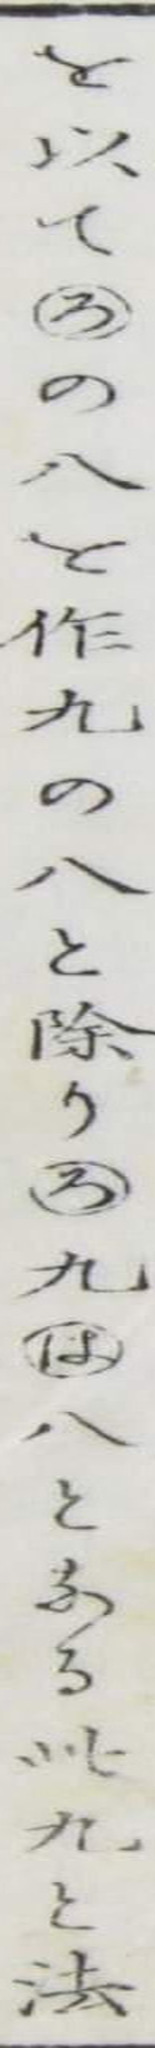を以て㋺の八を作九の八と除り㋺九㋩八となる此九と法
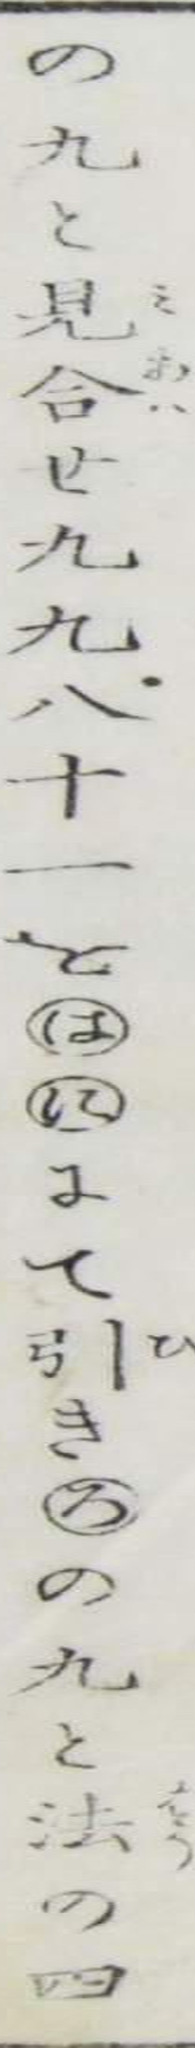の九と見合せ九九．八十一を㋩㋥にて引き㋺の九と法の四

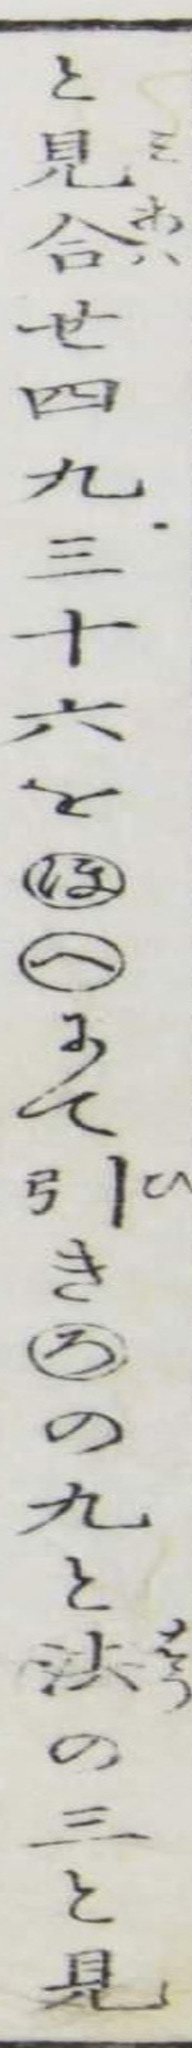と見合せ四九．三十六を㋭㋬にて引き㋺の九と法の三と見
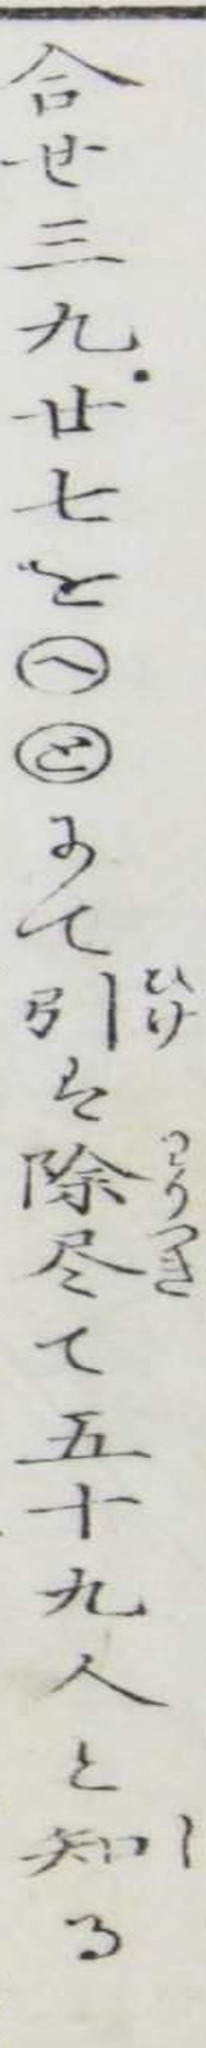合せ三九．廿七を㋬㋣にて引は除尽て五十九人と知る
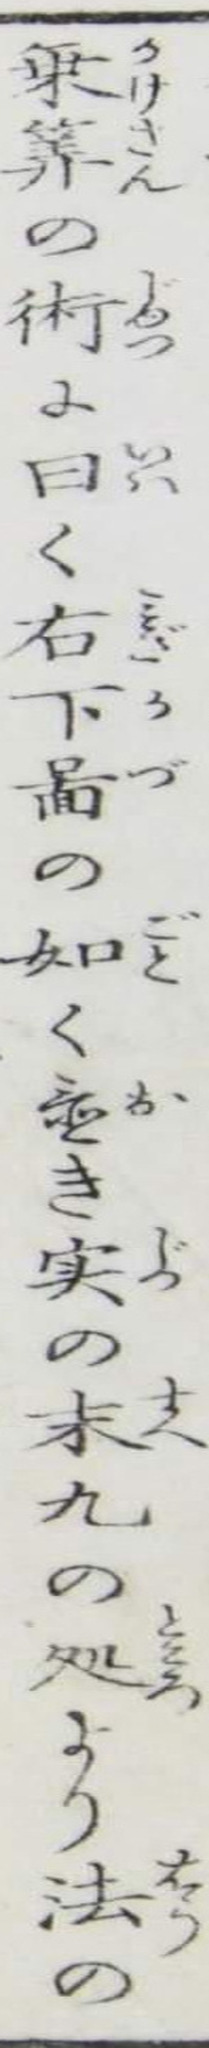乗算の術に曰く右下図の如く置き実の末九の処より法の
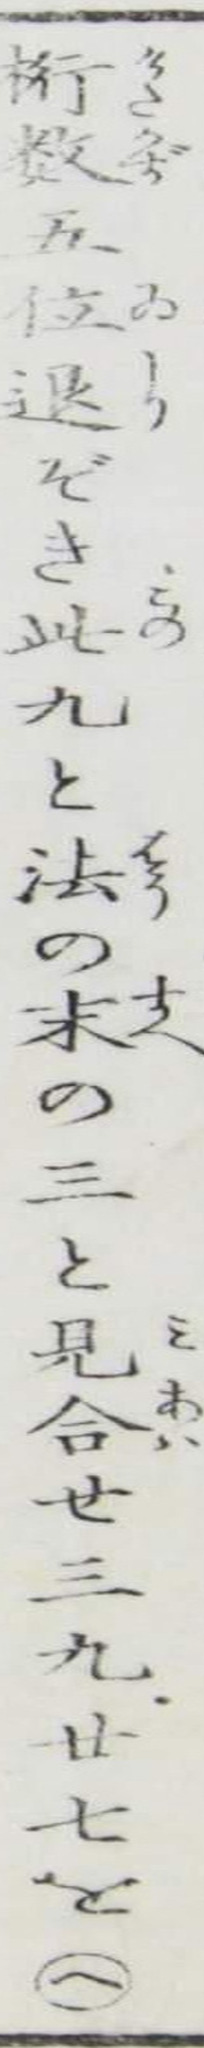桁数五位退ぞき此九と法の末の三と見合せ三九．廿七を㋬
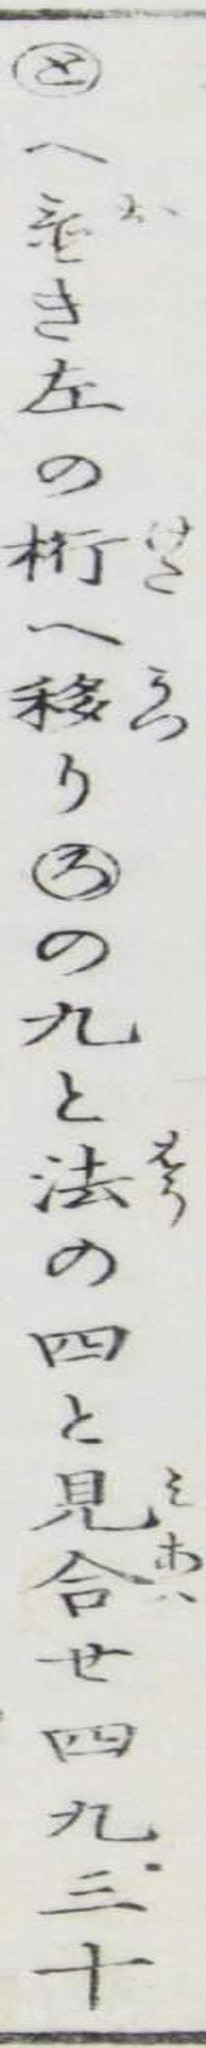㋣へ置き左の桁へ移り㋺の九と法の四と見合せ四九．三十
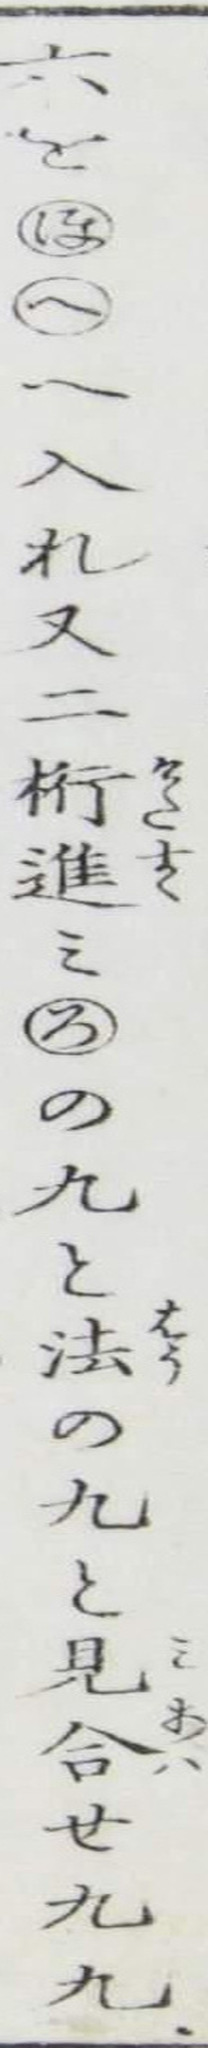六を㋭㋬へ入れ又二桁進み㋺の九と法の九と見合せ九九．
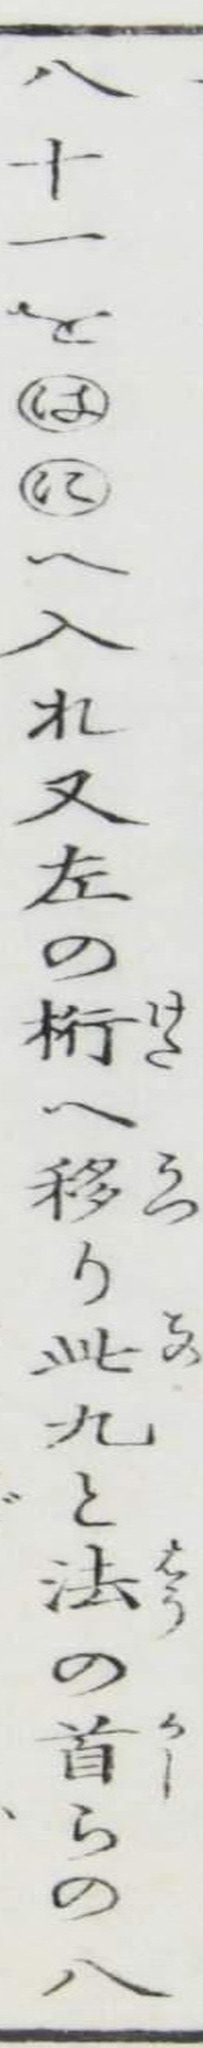八十一を㋩㋥へ入れ又左の桁へ移り此九と法の首らの八
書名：明治小學塵劫記 卷1
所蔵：東京学芸大学教育コンテンツアーカイブ
